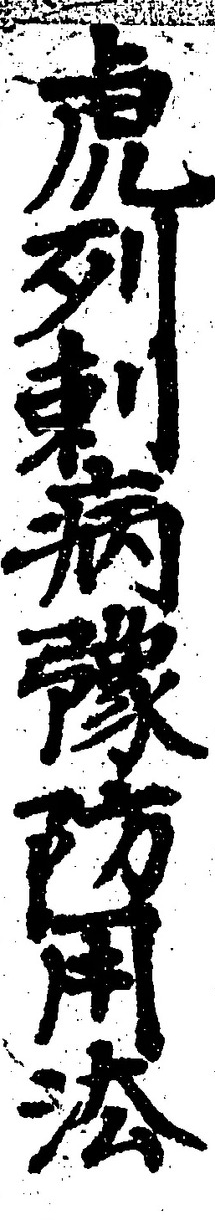虎列刺病豫防用法

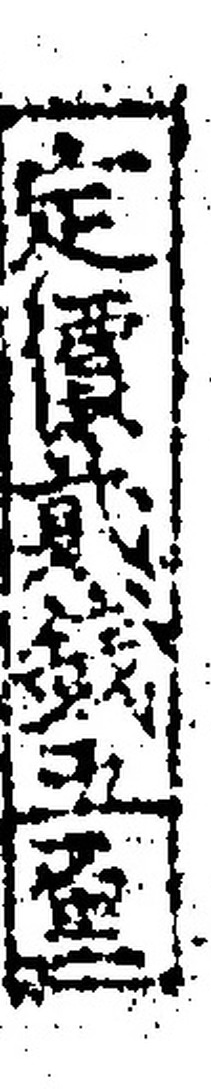定價貳銭五厘
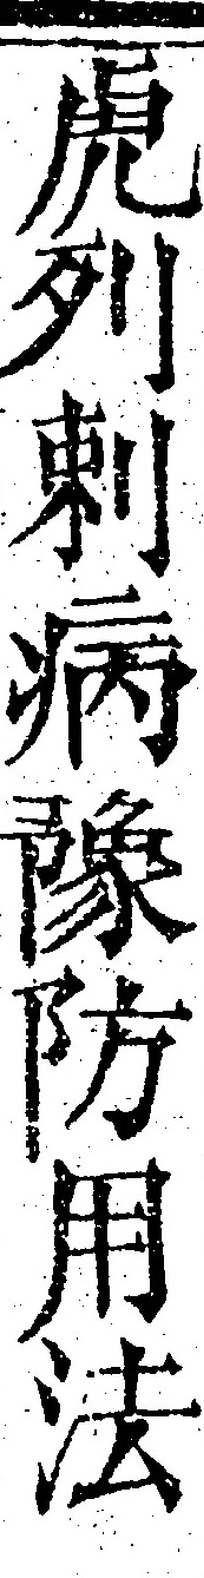虎列刺病豫防用法

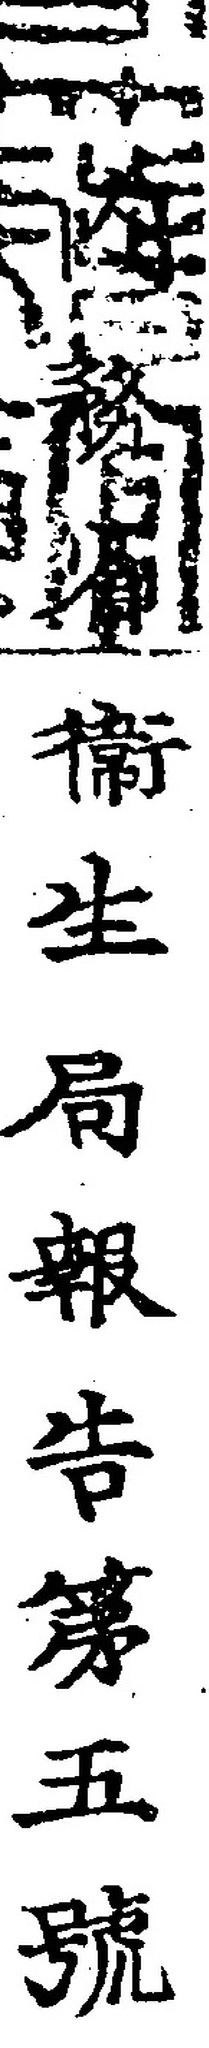内務省衛生局報告第五號
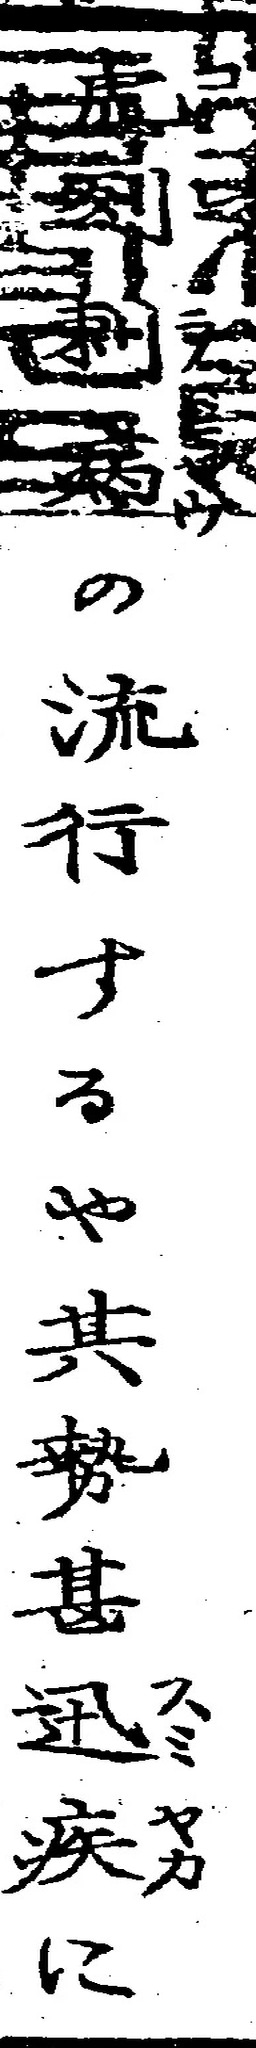虎列刺病の流行するや其勢甚迅疾に
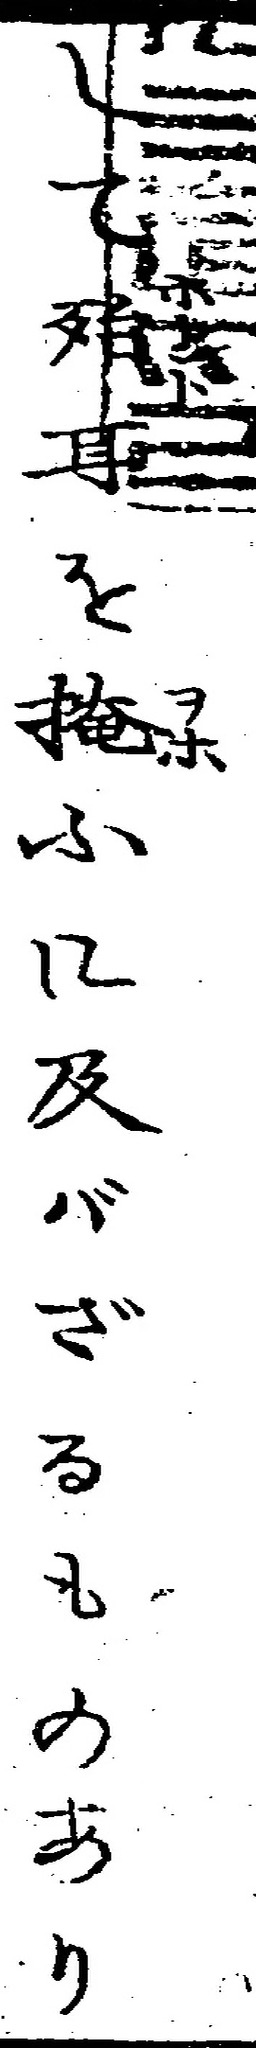して殆耳を掩ふに及ばざるものあり
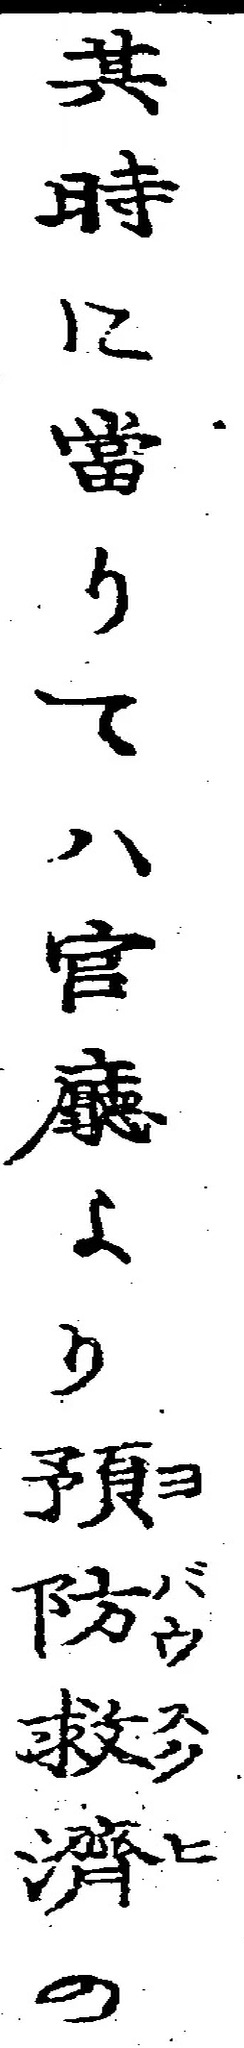其時に當りては官廳より預防救済の
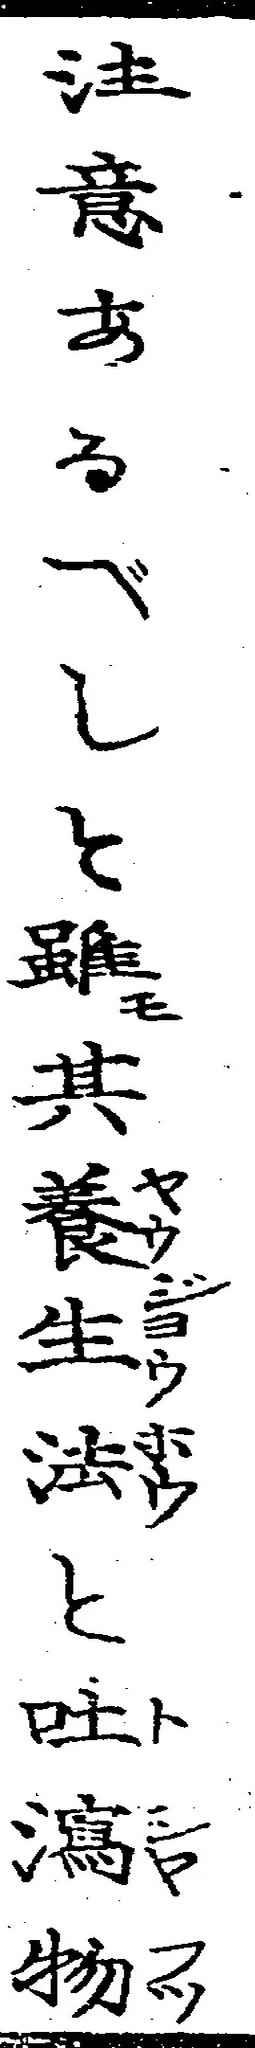注意あるべしと雖其養生法と吐瀉物
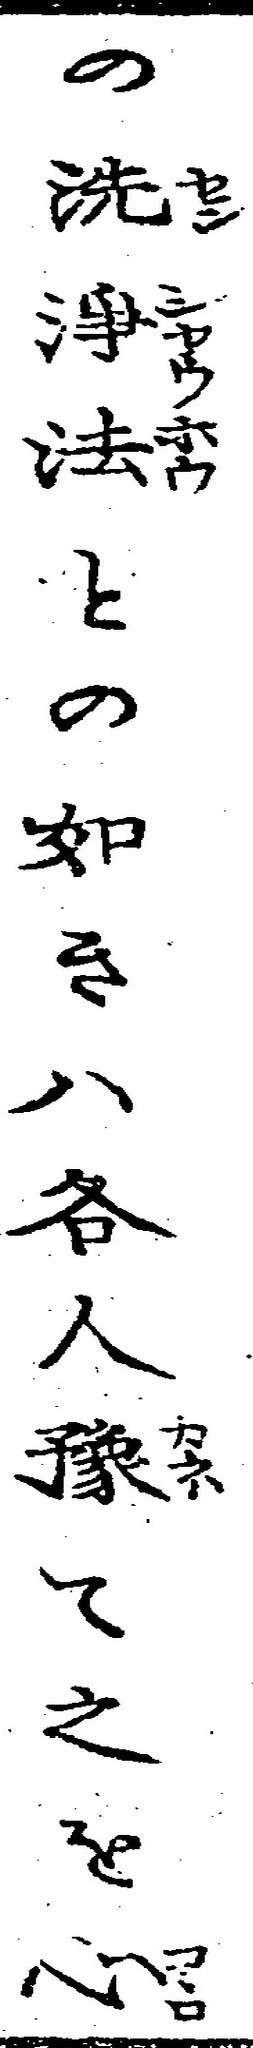の洗浄邦との如きは各人豫て之を心
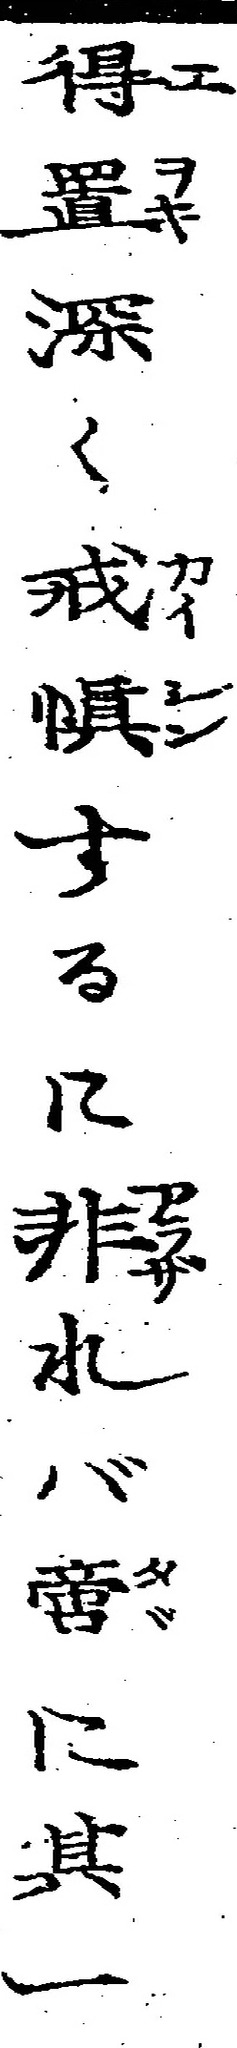得置深く戒慎するに非れば啻に其一

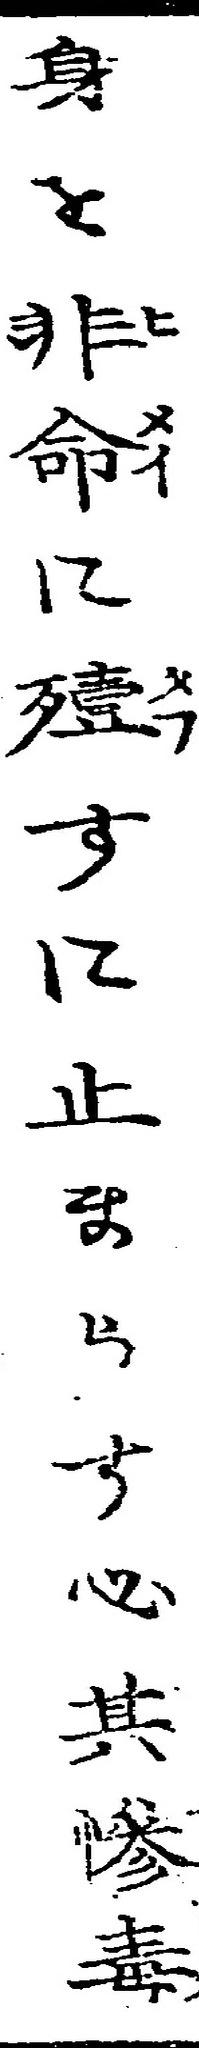身を非命に殪すに止まらす心其惨毒
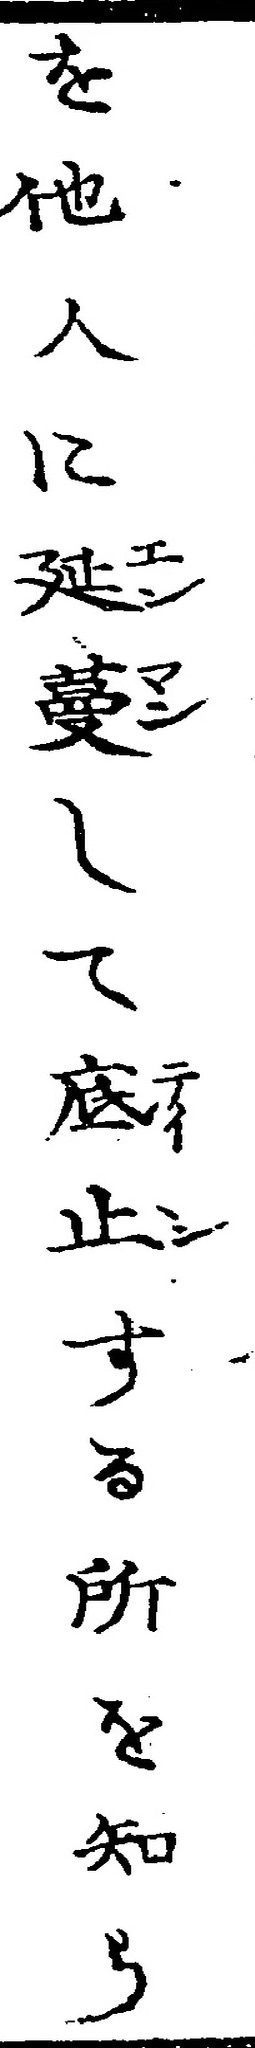を他人に延萬して底止する所を知ら
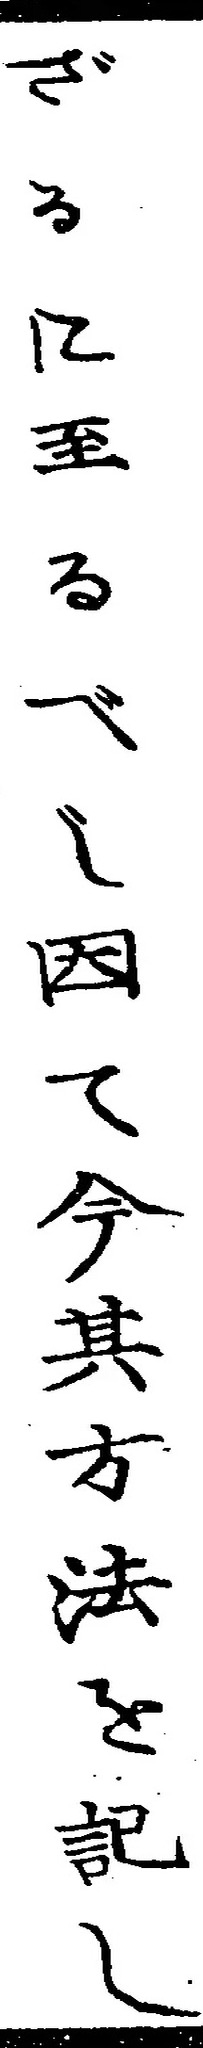ざるに至るべし因て今其方法を記し
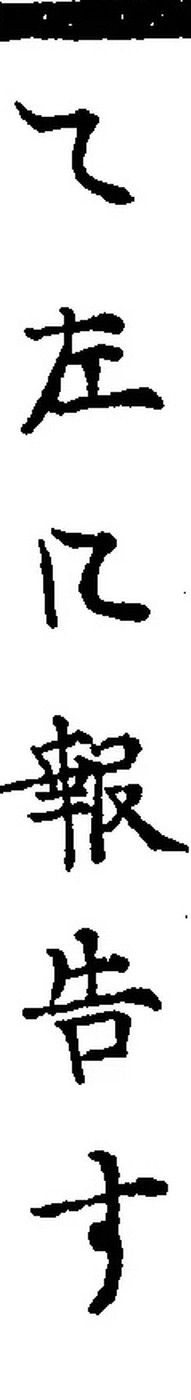て左に報告す
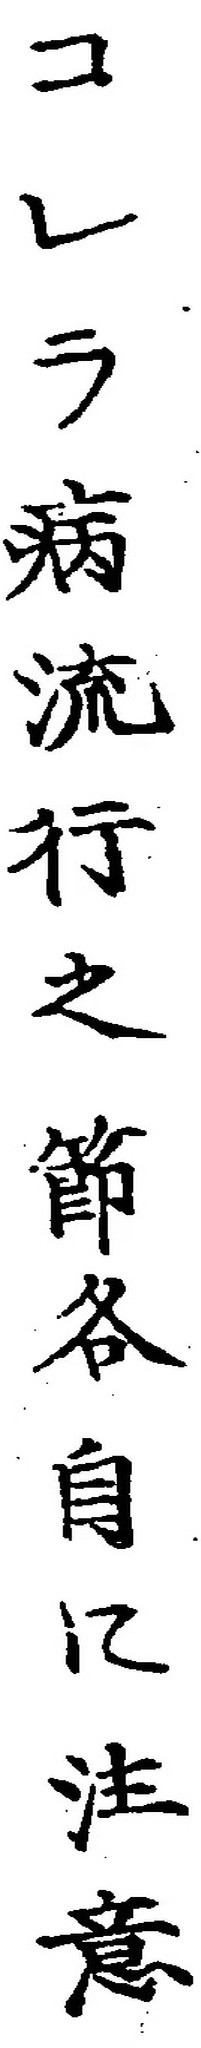コレラ病流行之節各自に注意
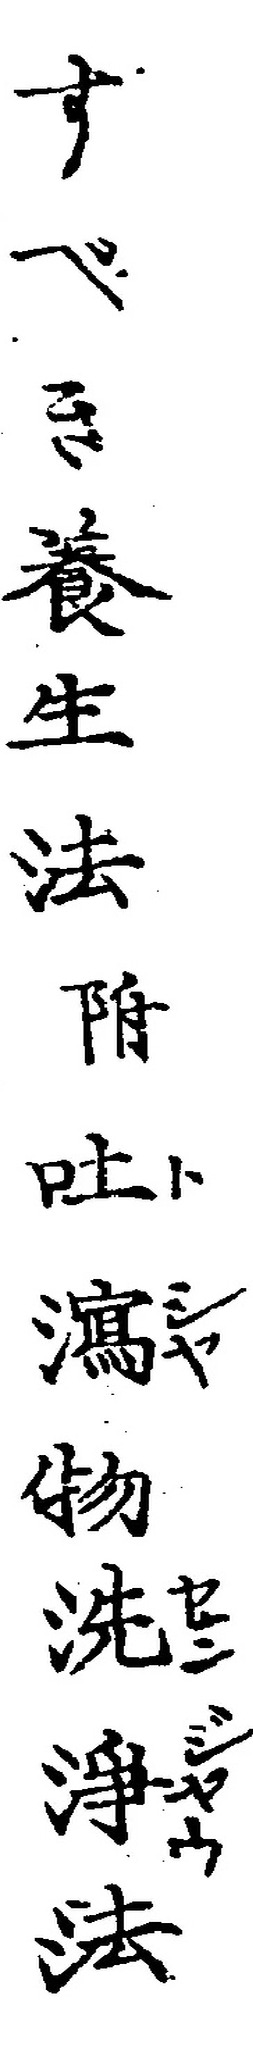すべき養生法附吐瀉物洗浄法
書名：虎列剌病予防用法
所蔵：国立国会図書館 National Diet Library, JAPAN
